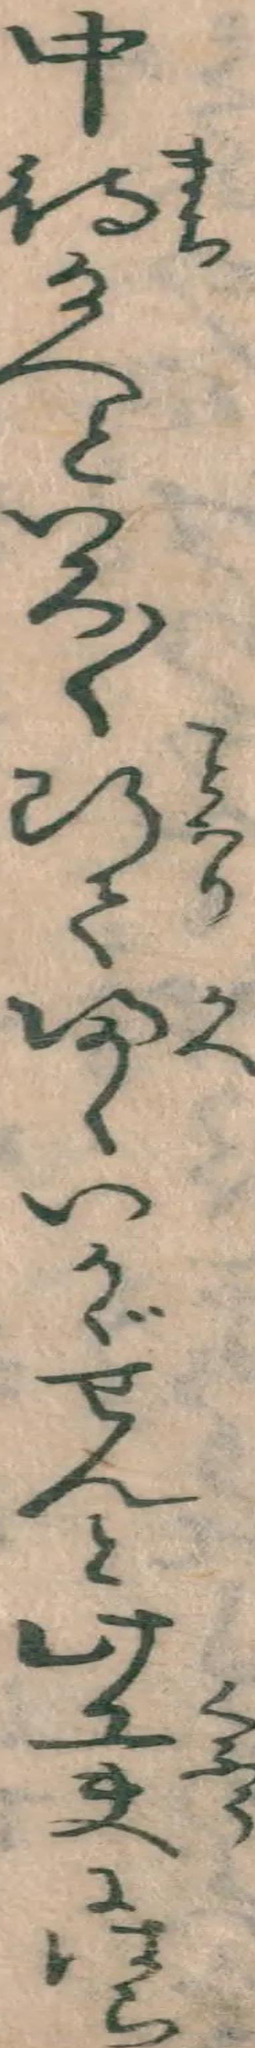中待給へといろ〳〵断て帰しいかゞせんと此工夫にはら
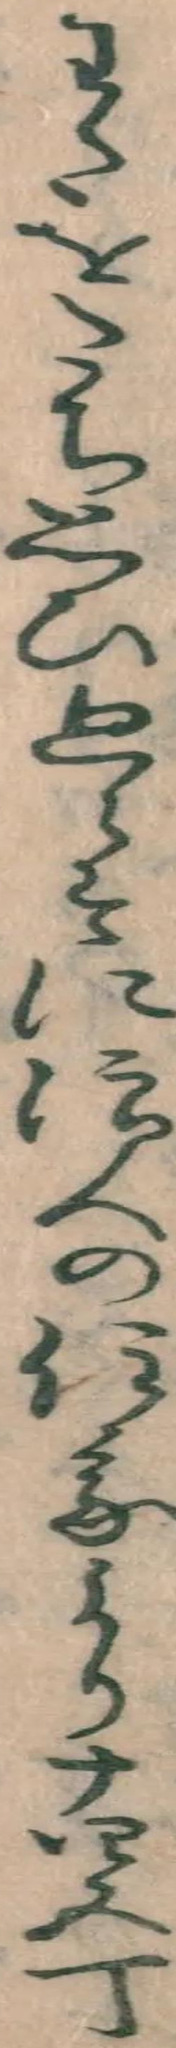わたをたち思ひ廻らすに浪人の住家より十四五丁
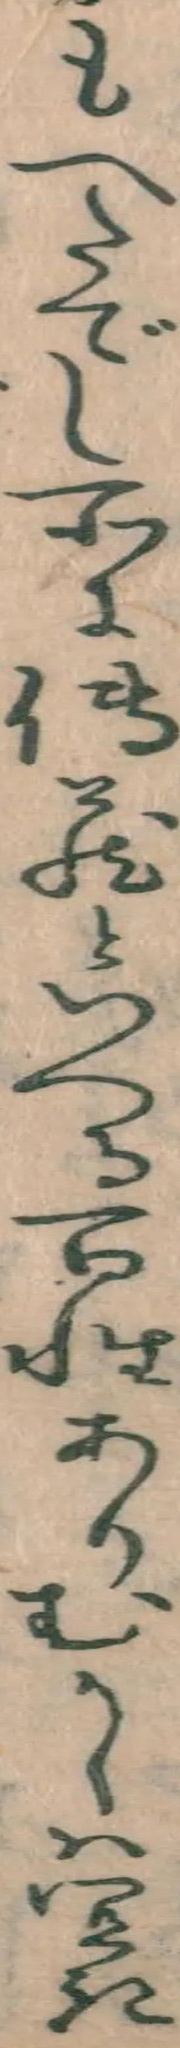もへたでし所に伝蔵といへる百姓ありむかしは宜き
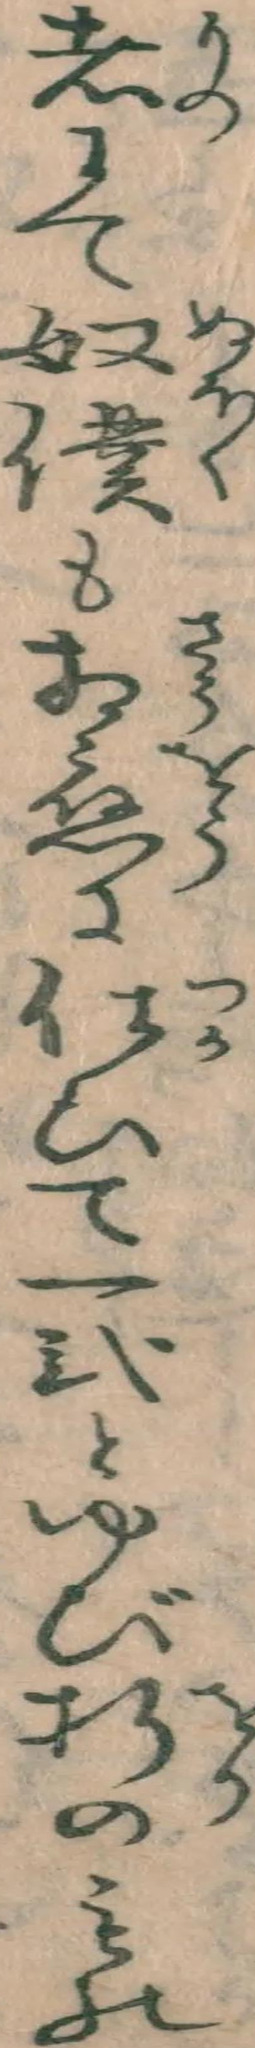者にて奴僕も相応に仕ひて一弐とゆび折のもの
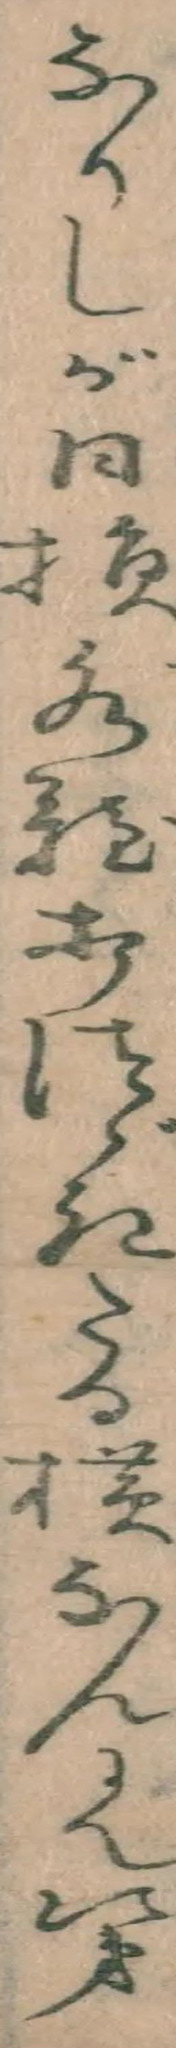なりしが日損水難打つゞきたる横なんにて次第
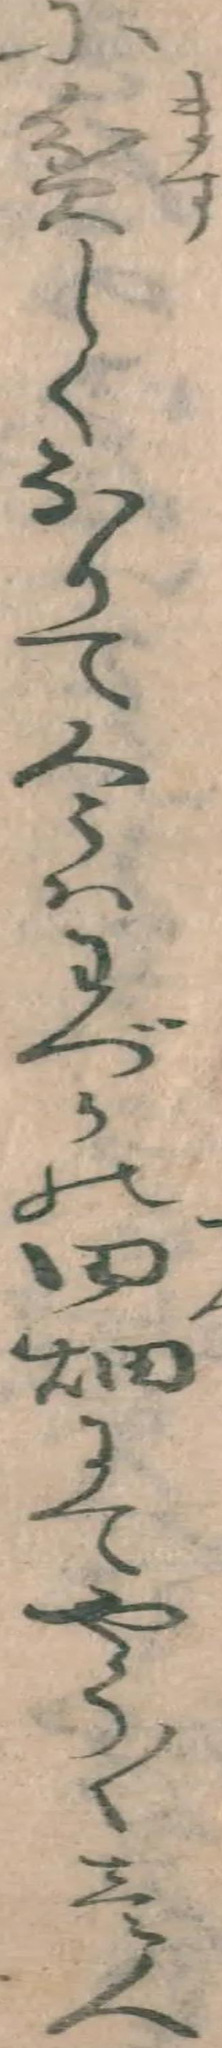に貧しくなりて今はわづかの田畑にてやう〳〵壱人
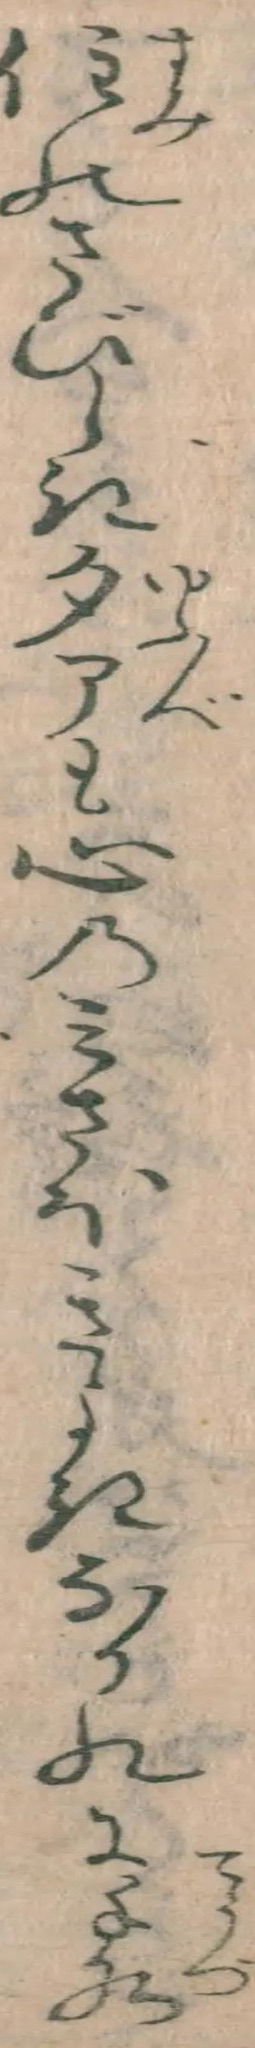住のさびしき夕部も心のみさほきよきなかれに手水
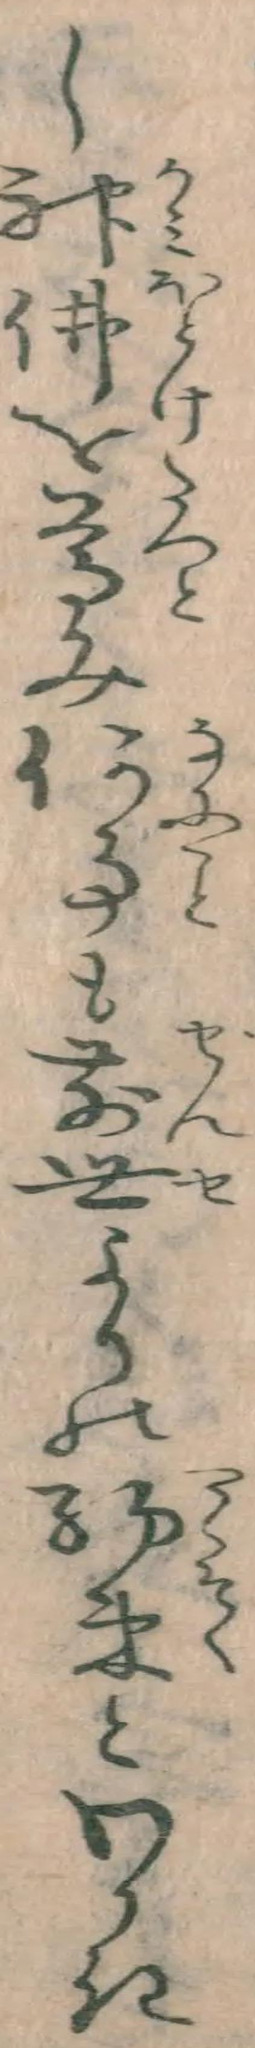し神仏を尊何事も前世よりの約束とわかき
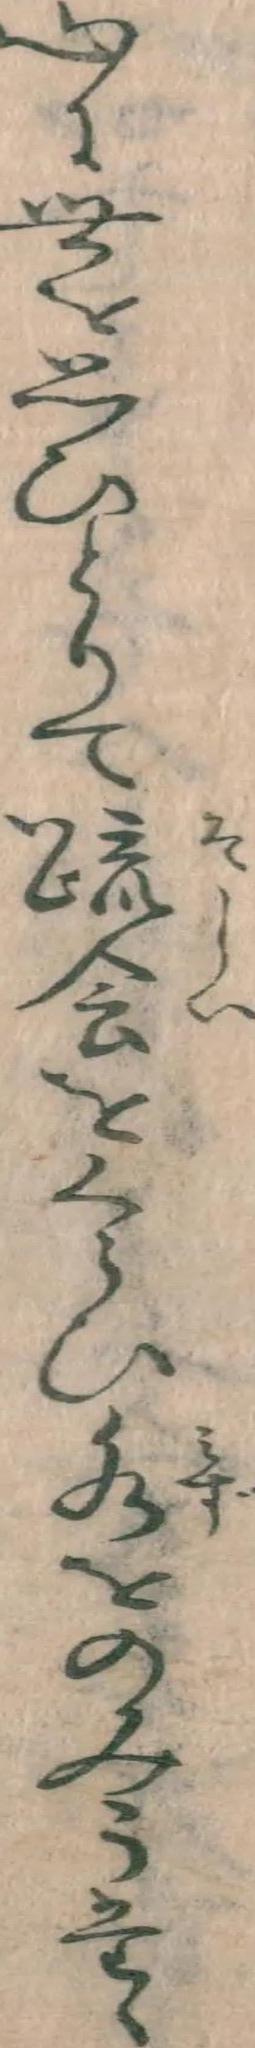心に世を思ひとりて疏食をくらひ水をのみうたゝ
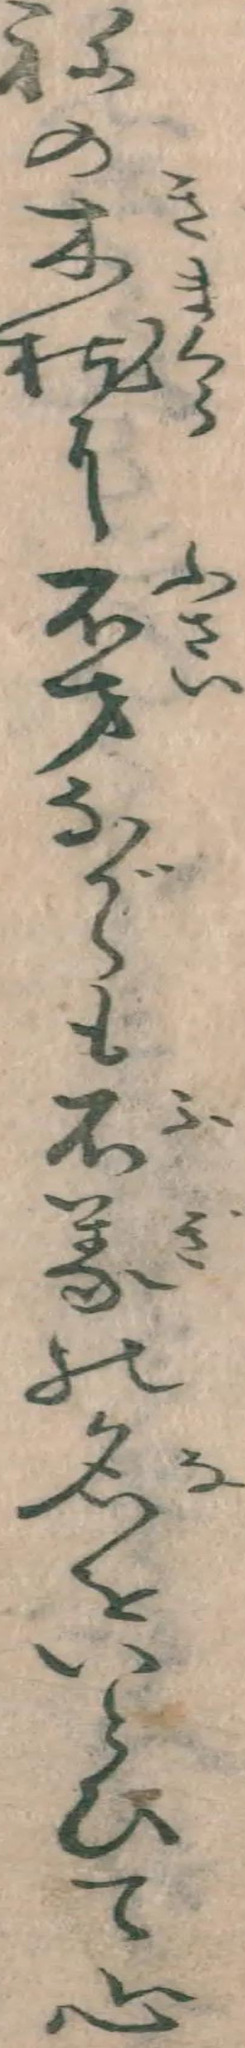ねの木枕に不才ながらも不義の名をいとひて心
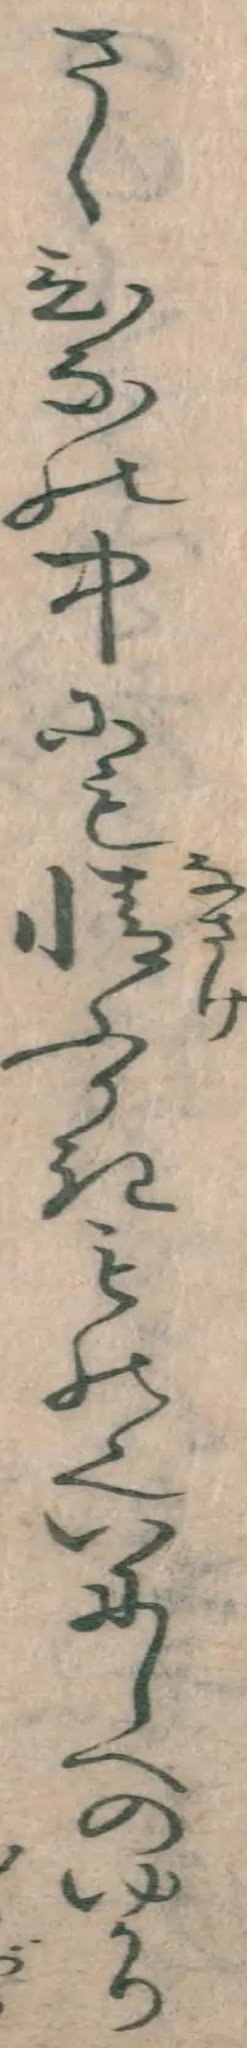さしひなの中にも情ふかきもの也いにしへのゆかり
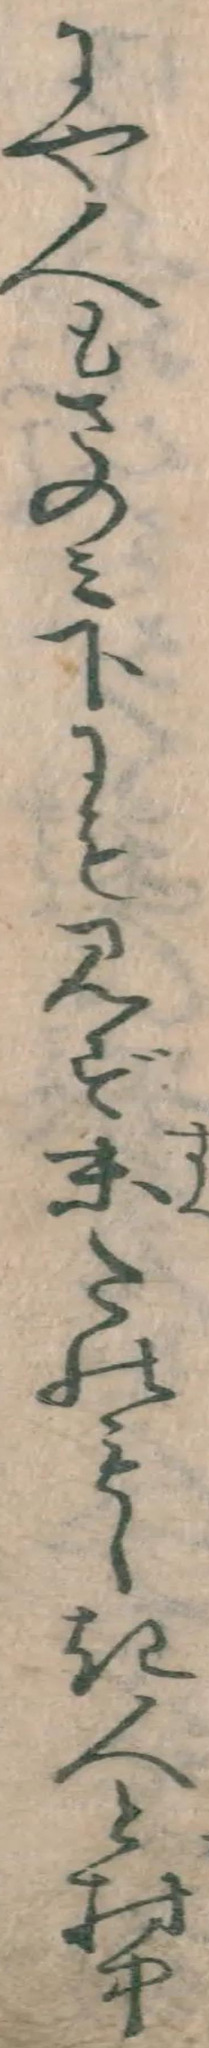にや人もさのみ下にも見ず末たのもしき人と村中
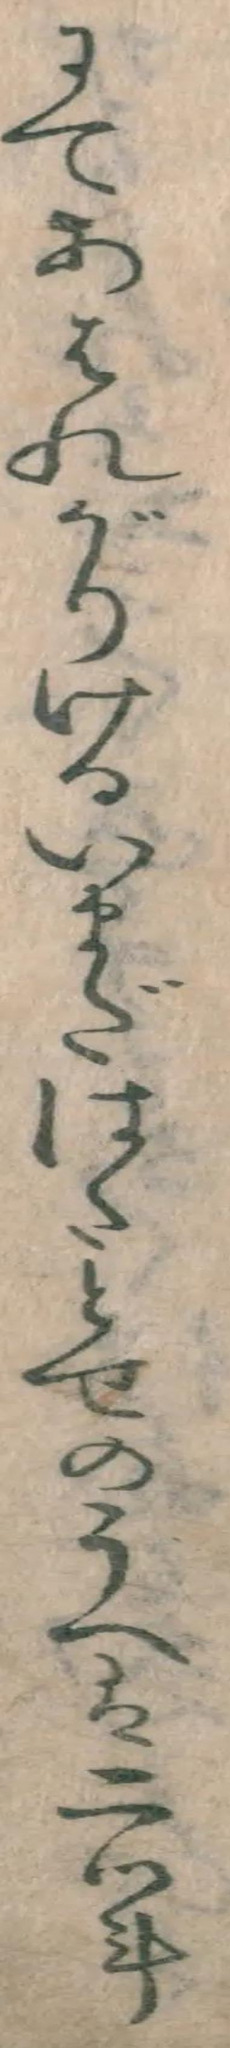にてあはれがりけるいまだはたとせのうへは二つ斗
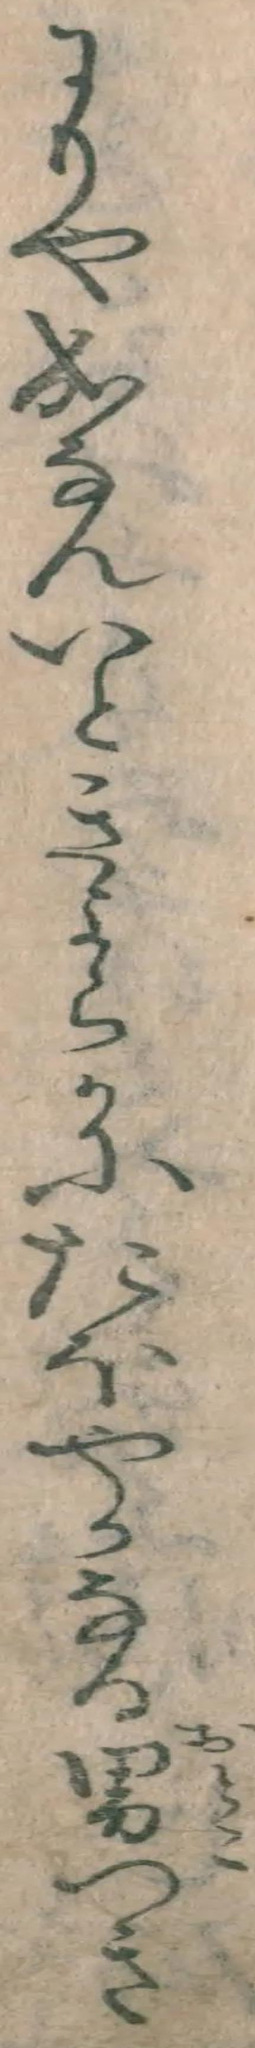にもや成なんいときよらかにたほやかなる男つき
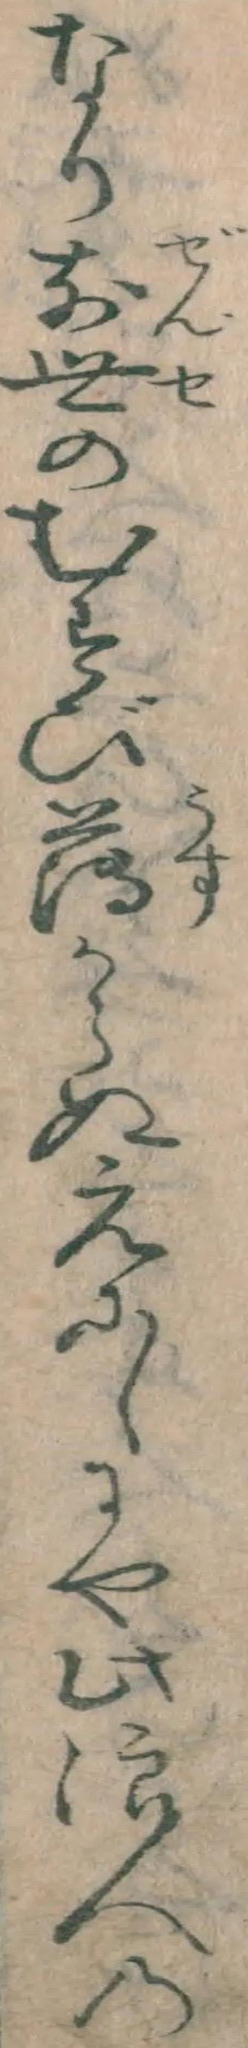なり前世のむすび薄からぬえにしにや此浪人の

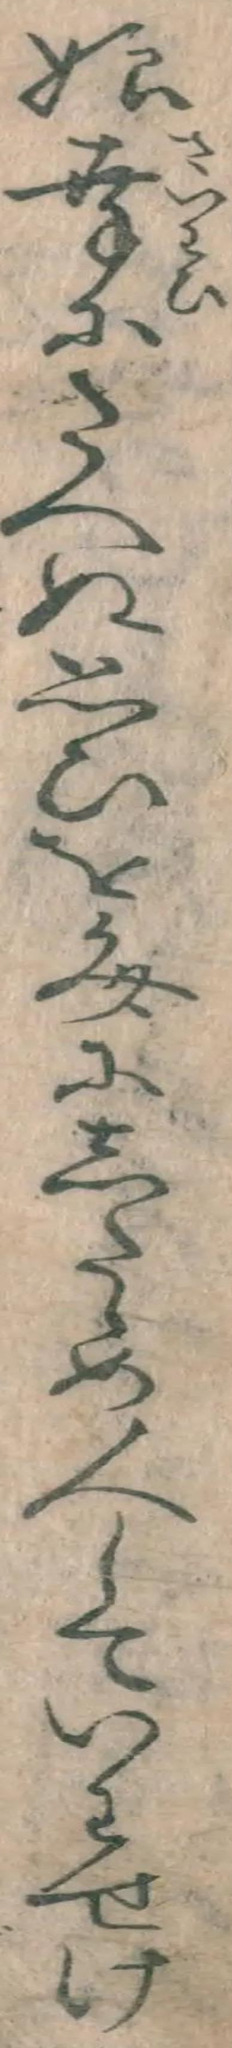娘幸にたへぬ思ひを文にしたゝめ人していわせけ
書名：怪談御伽童 5巻. [2]
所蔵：国立国会図書館 National Diet Library, JAPAN
